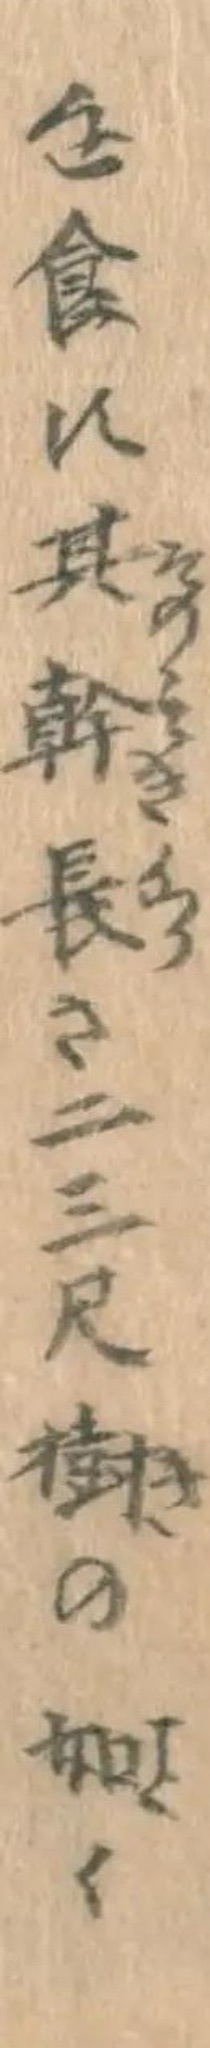を食す其幹長さ二三尺樹の如く
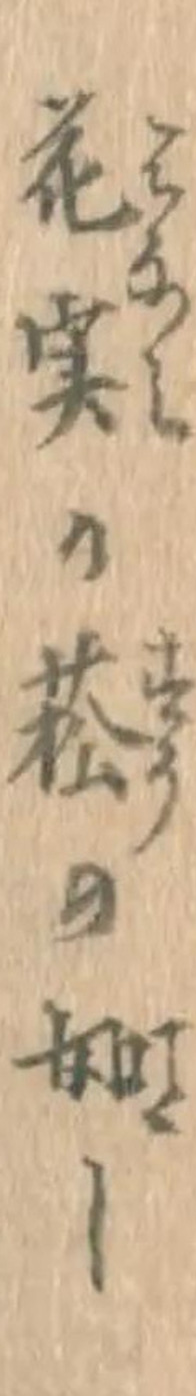花実は菘の如し

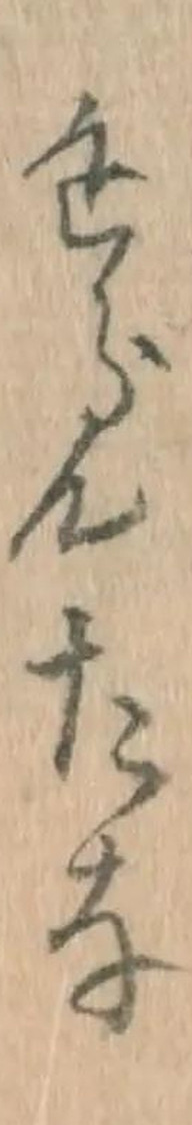をらんたな

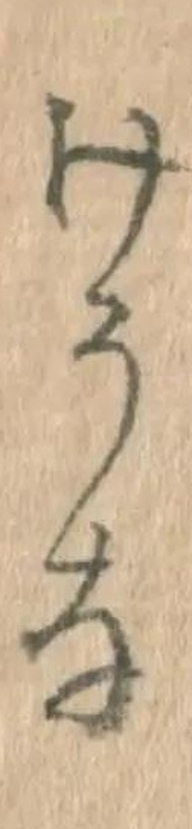けうな
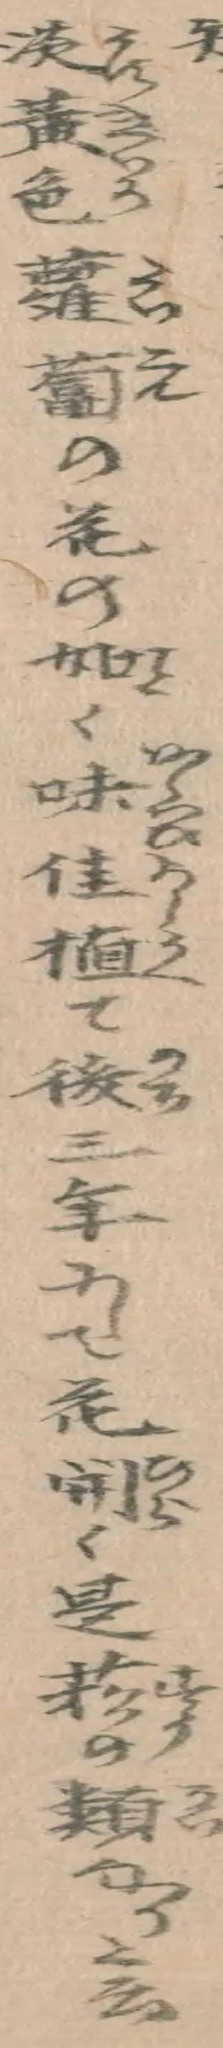淡黄色蘿蔔の花の如く味佳植て後三年にして花開く是菘の類なりと云
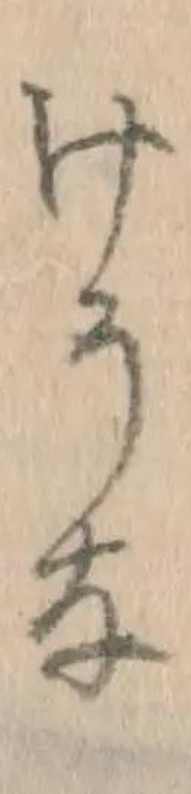けうな
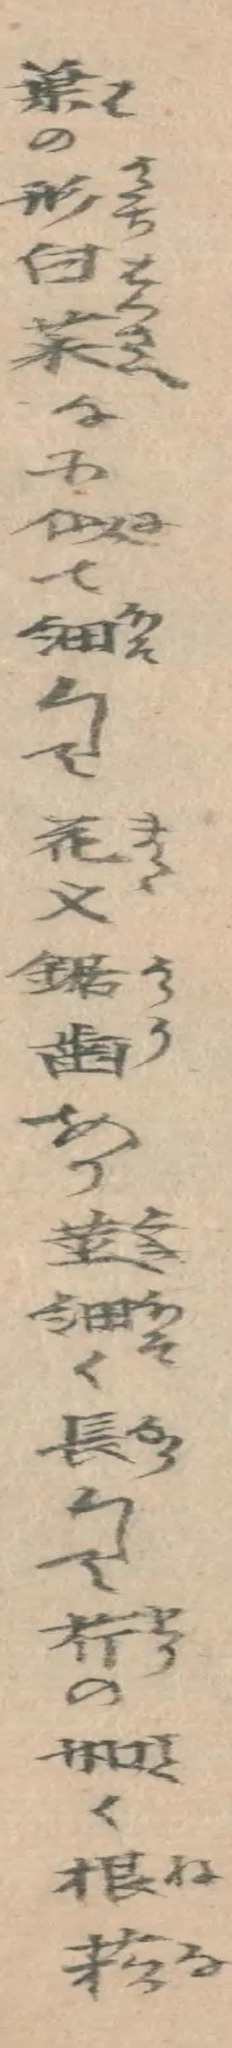葉の形白菜なに似て細くして花叉鋸歯あり茎細く長くして芹の如く根菘
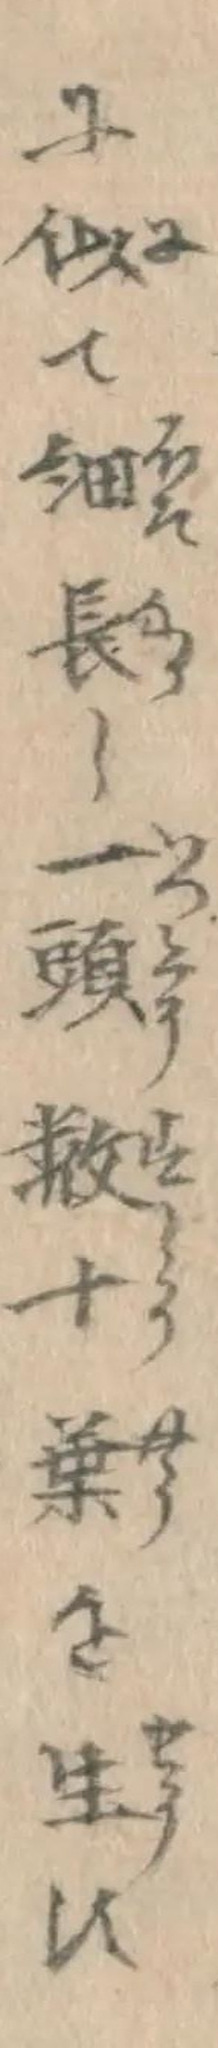に似て細長し一頭数十葉を生す

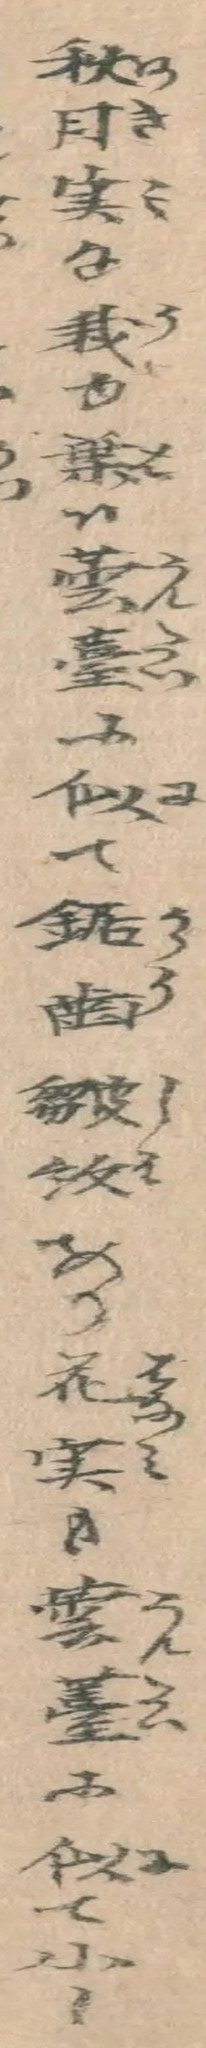秋月実を栽ゆ葉は蕓薹に似て鋸歯皺紋あり花実も蕓薹に似て小し
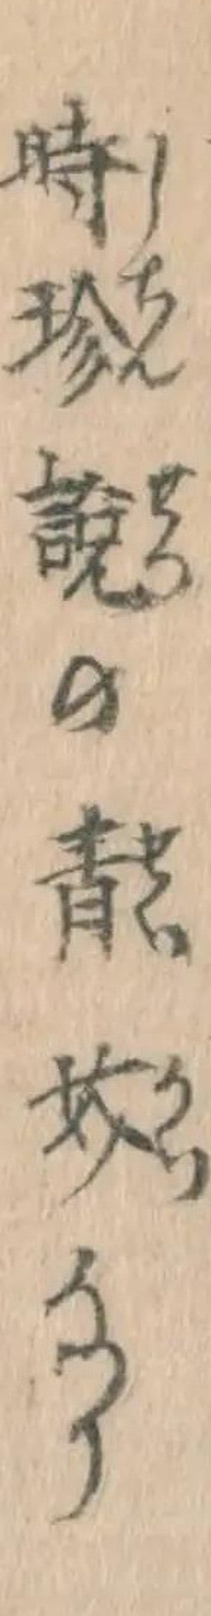時珍説の青芥なり
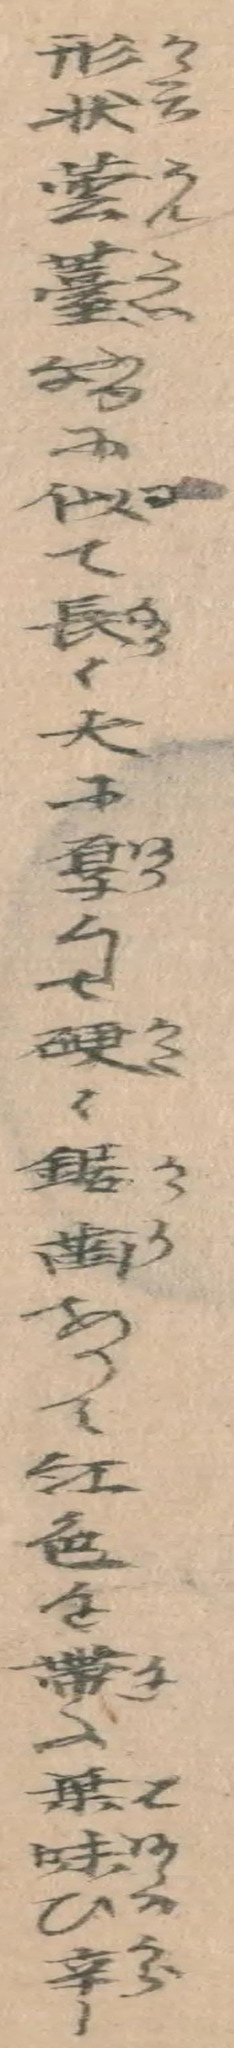形状蕓薹ふゆなに似て長く大に厚くして硬く鋸歯ありて紅色を帯ふ葉味ひ辛し
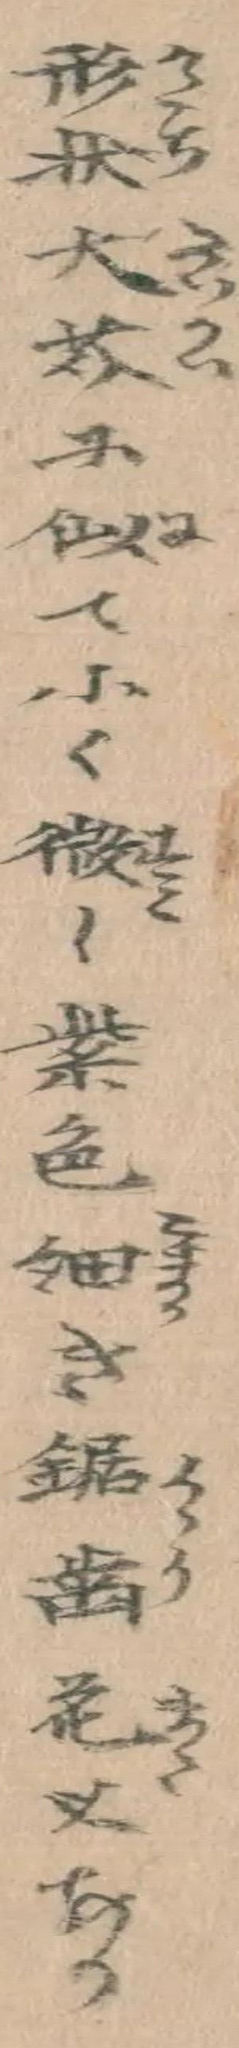形状大芥に似て小く微し紫色細き鋸歯花叉あり
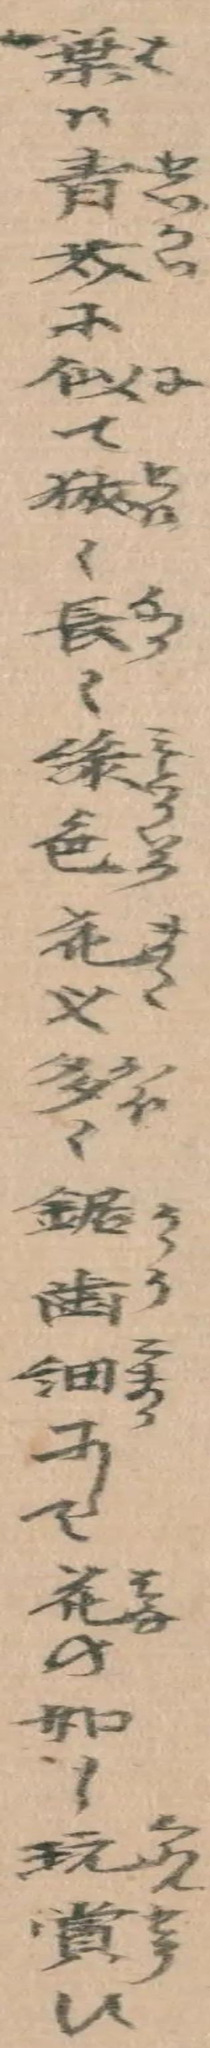葉は青芥に似て狭く長く緑色花叉多く鋸歯細にして花の如し玩賞す

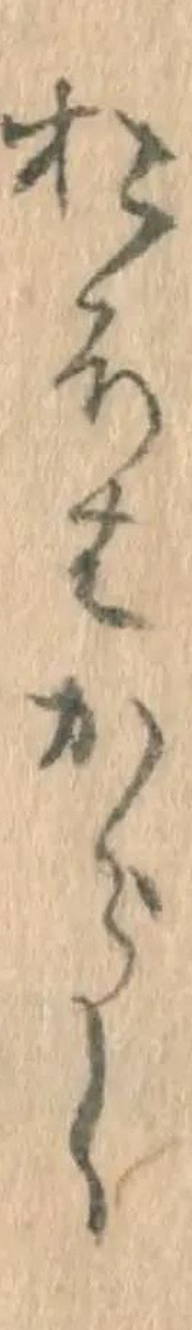おほはからし

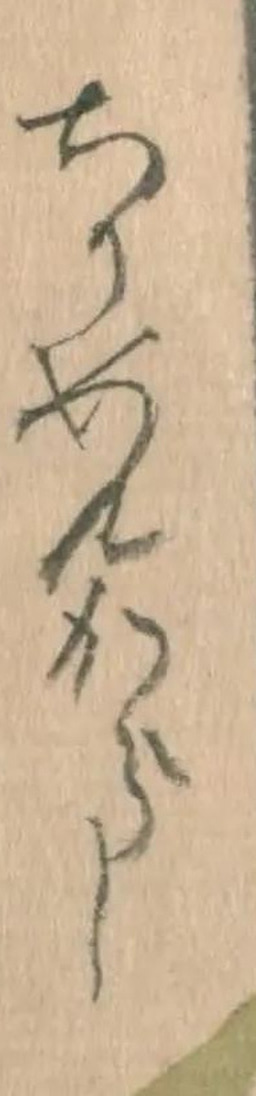ちりめんからし

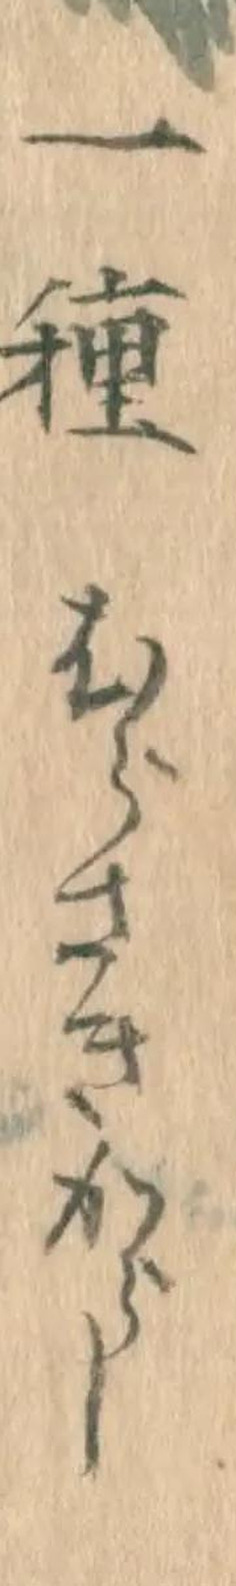一種むらさきからし
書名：本草図譜. 巻46-48
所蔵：国立国会図書館 National Diet Library, JAPAN
